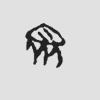眾
